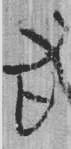右
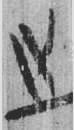之
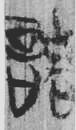請
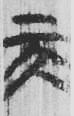天
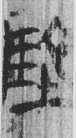○（地）
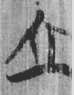立
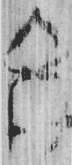終
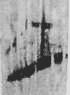立
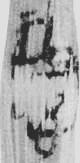○（始）
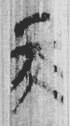天
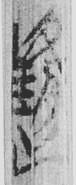○（降）
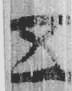五
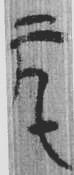厇（度）
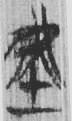𫊟（乎）
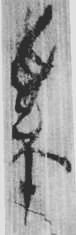奚（奚）
